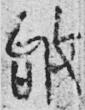敂（姤）
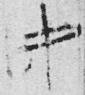女
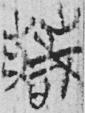○（藏）
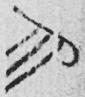勿
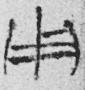用
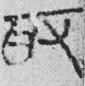取（娶）
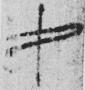女
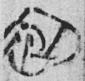初
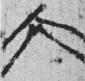六
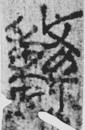繫
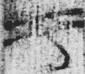于
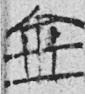金
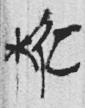柅
